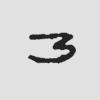乃
